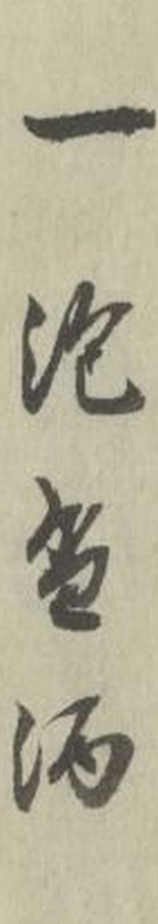一泡盛酒二壺
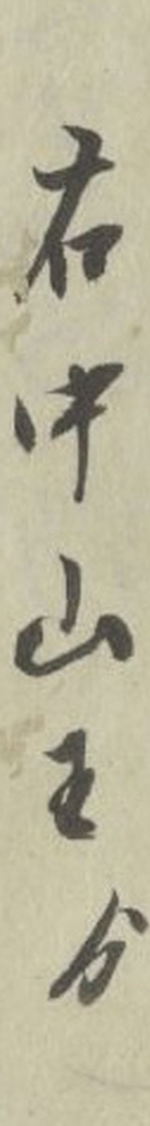右中山王ゟ
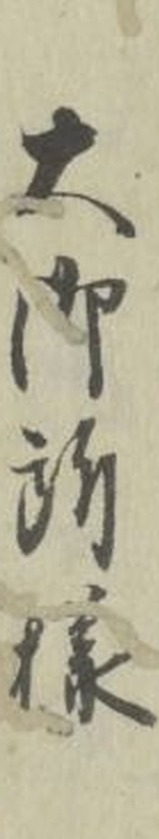大御所様
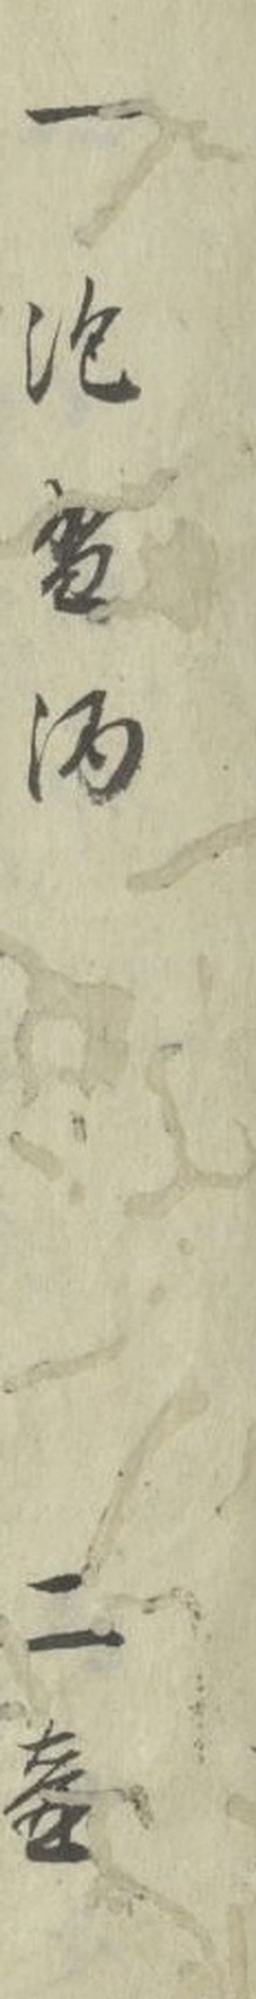一泡盛酒二壺
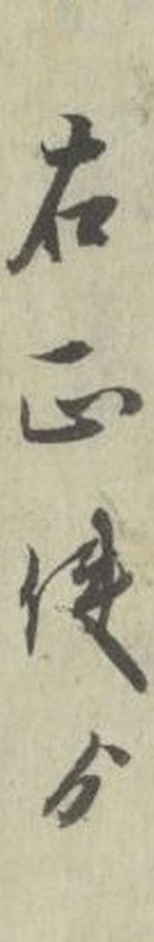右正使ゟ
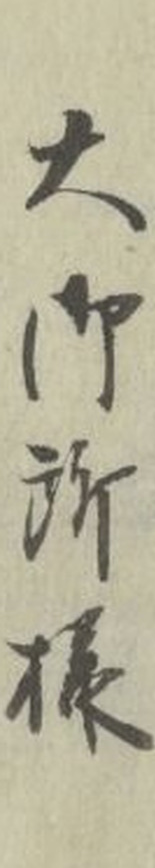大御所様
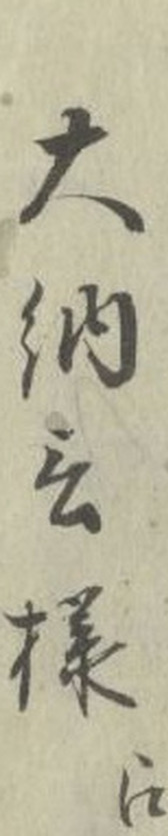大納言様え
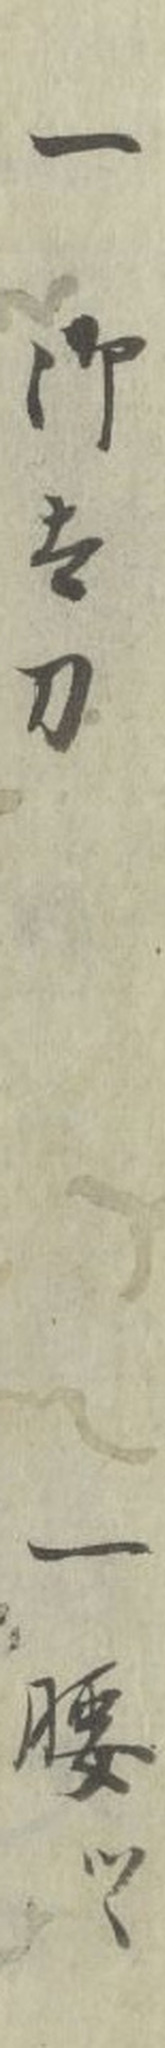一御太刀一腰ツヽ

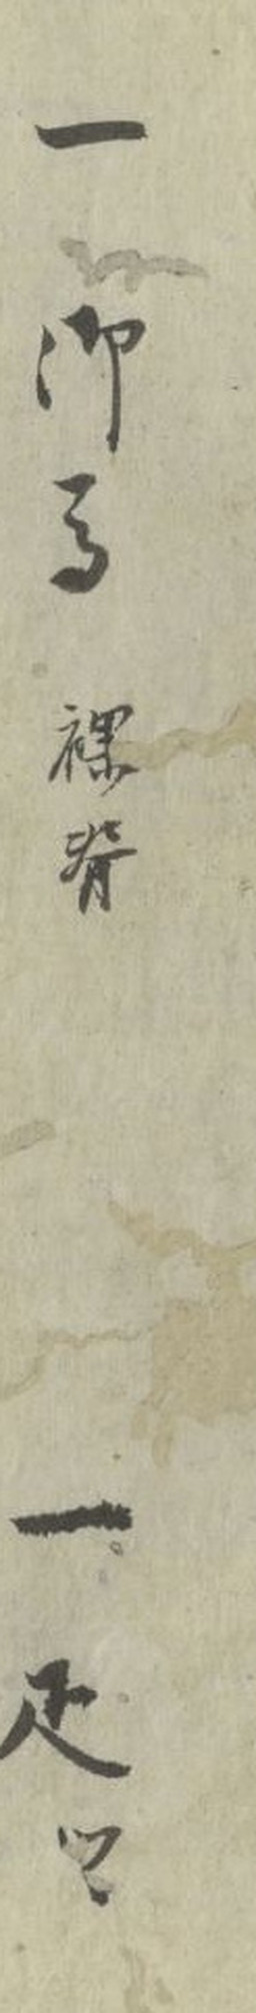一御馬裸背一疋ツヽ
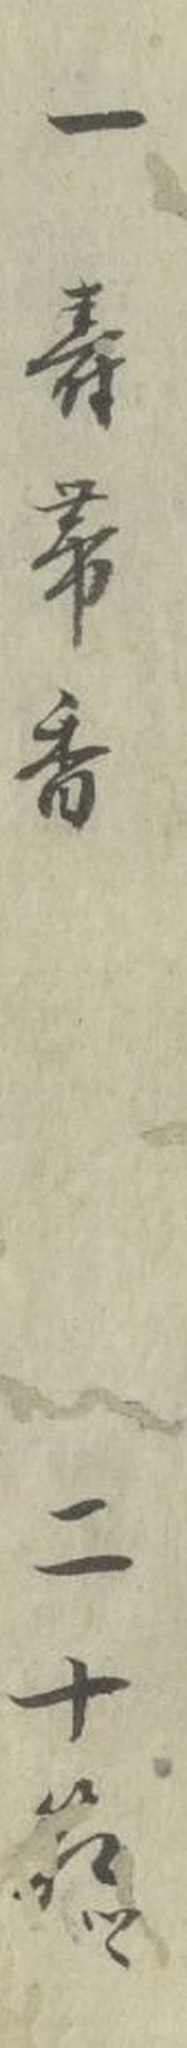一寿帯香二十箱ツヽ
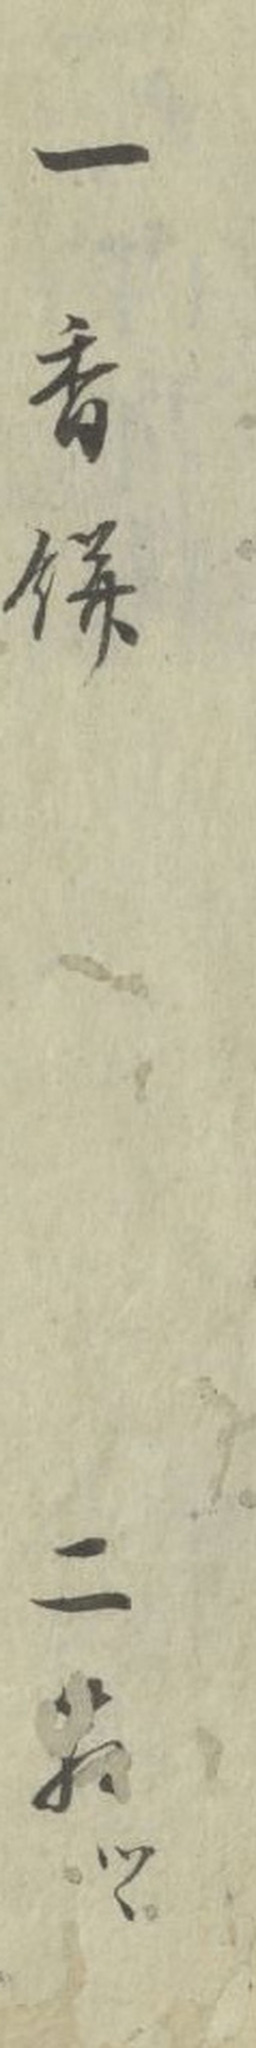一香餅二箱ツヽ
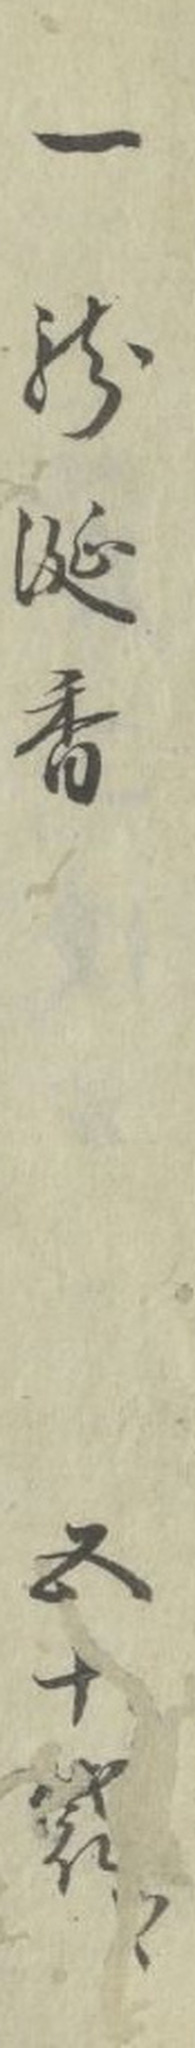一龍涎香五十袋ツヽ
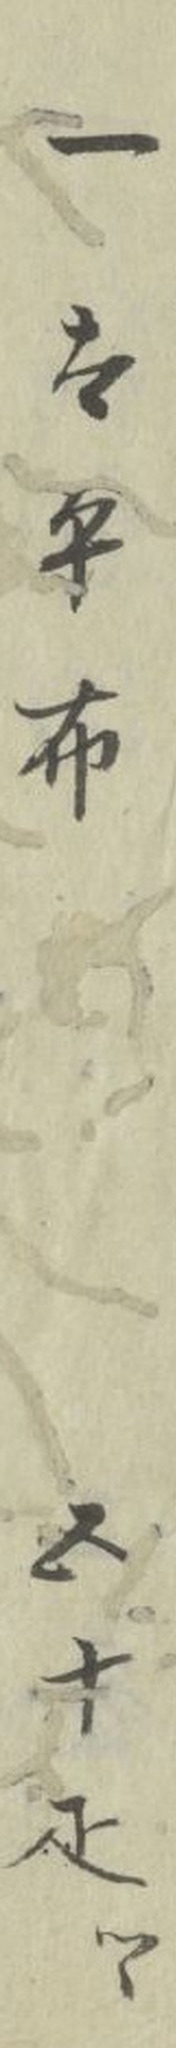一太平布五十疋ツヽ
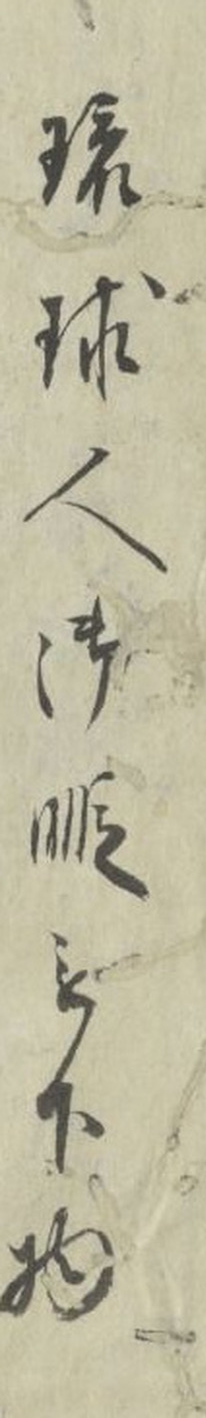琉球人御暇被下物
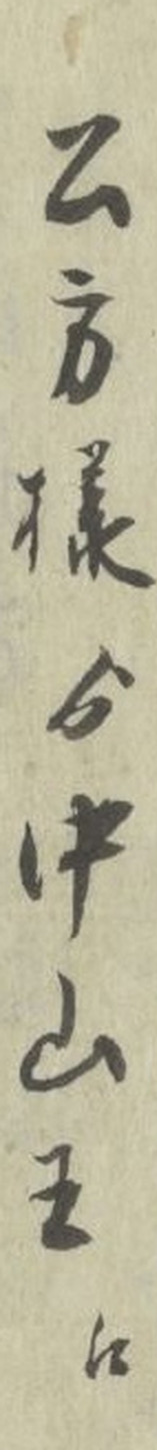公方様ゟ中山王え
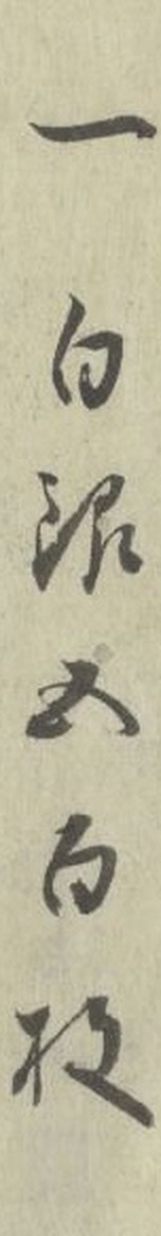一白銀五百枚
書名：琉球来朝記 自八至十四終
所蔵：University of the Ryukyus Library
